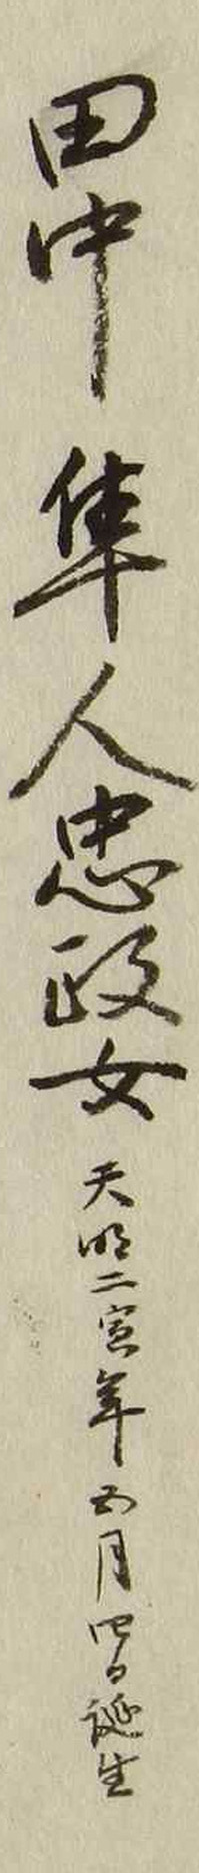田中隼人忠政女天明二寅年五月四日誕生
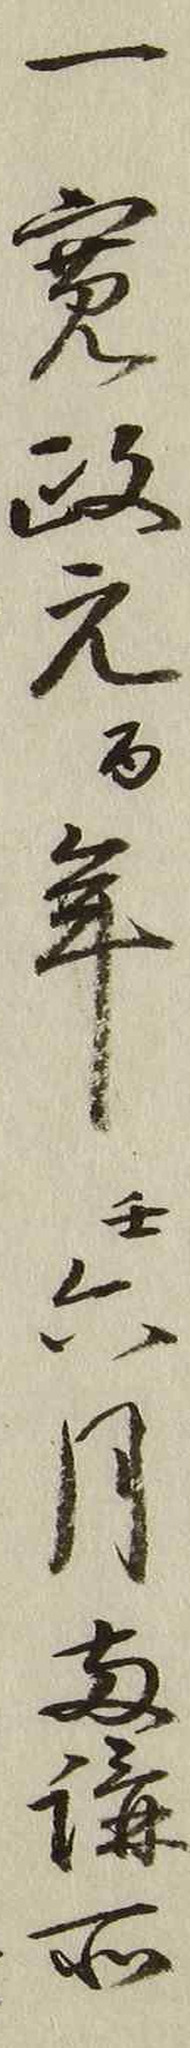一寛政元酉年閏六月両講所
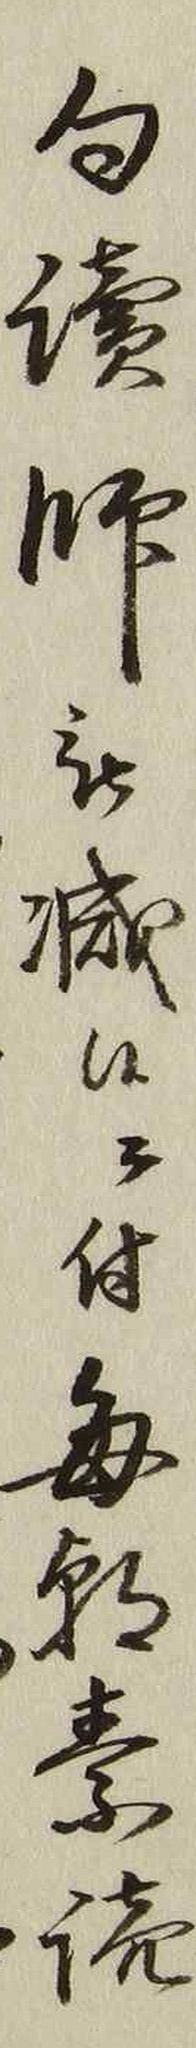句読師被減候ニ付毎朝素読
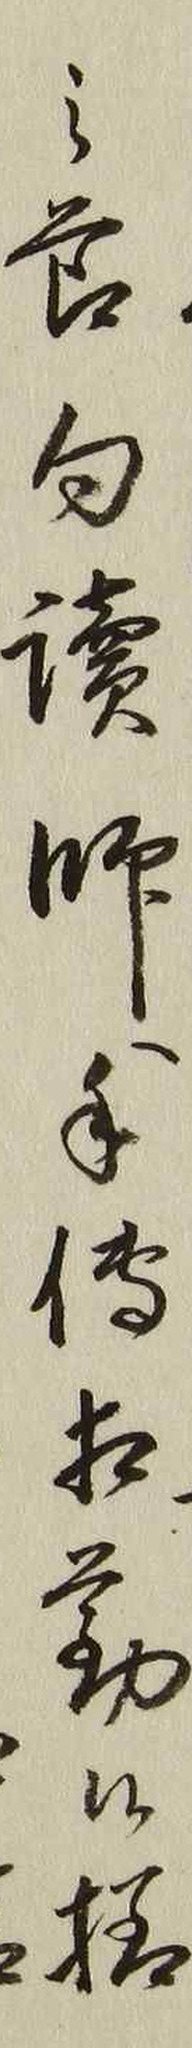之節句読師へ手伝相勤候様
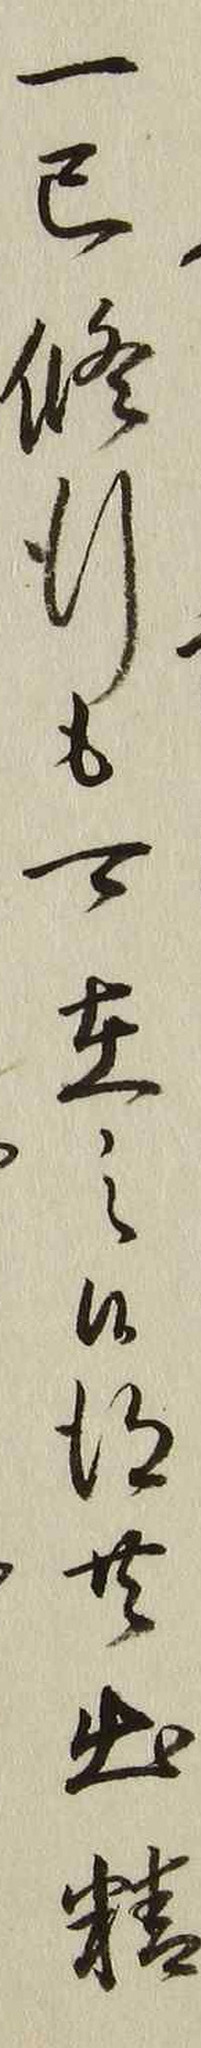一己修行も可在之候得共出精
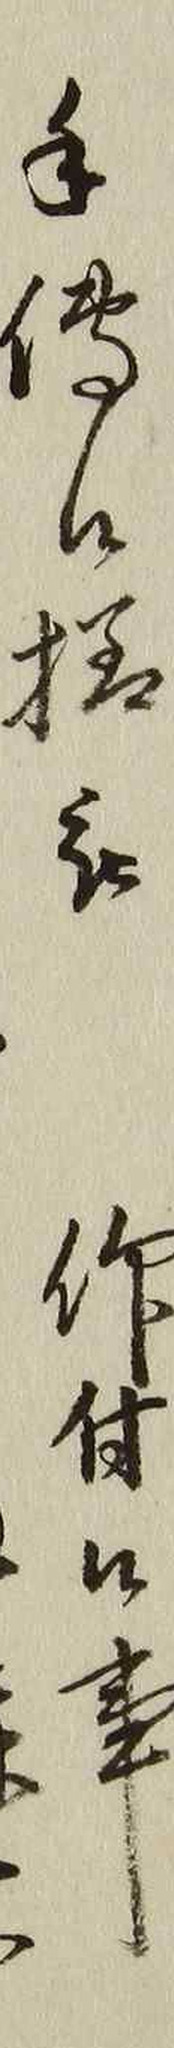手伝候様被仰付候事
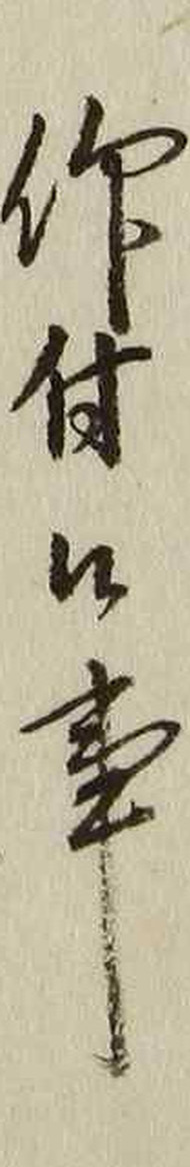仰付候事
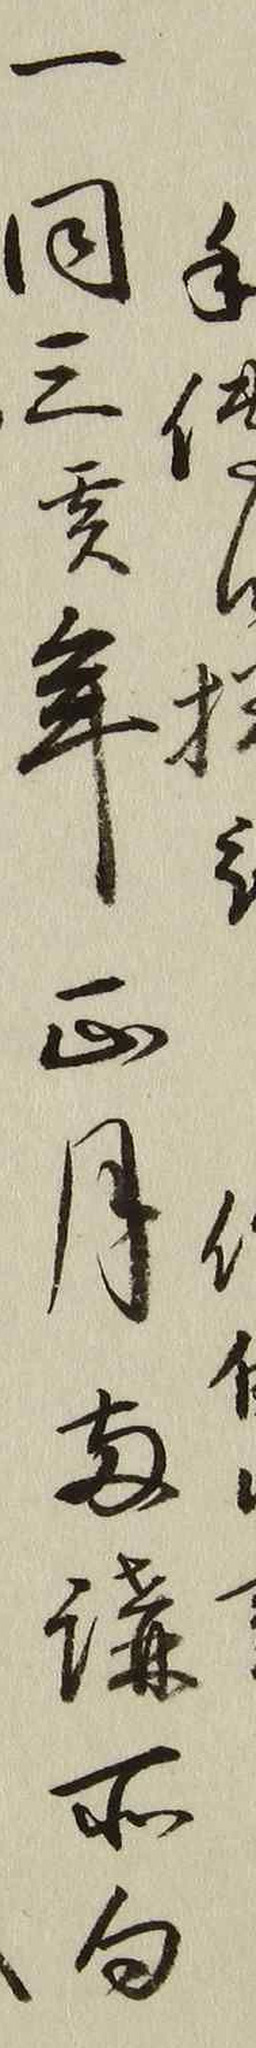一同三亥年正月両講所句
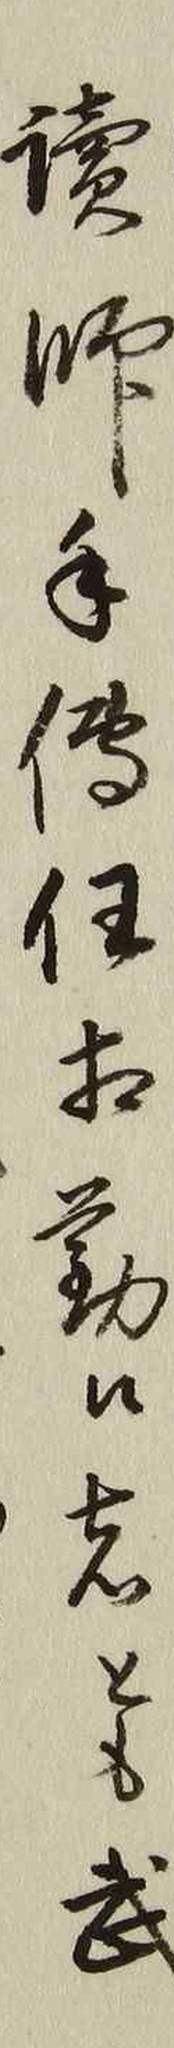読師手伝任相勤候者とも武
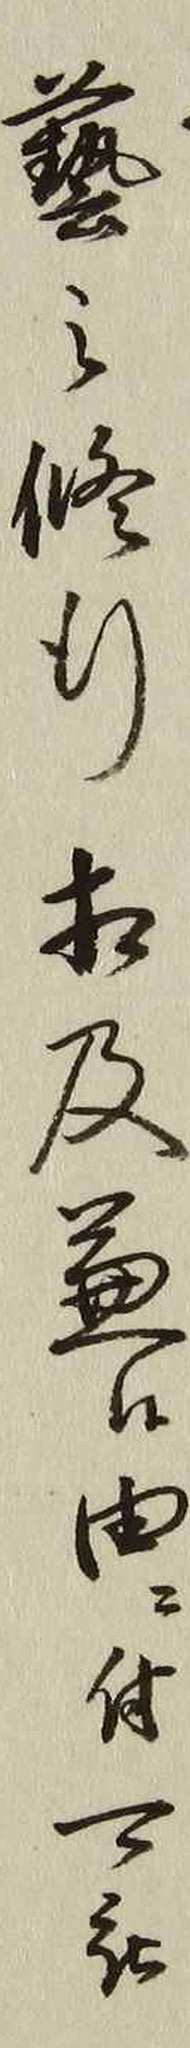芸之修行相及兼候由ニ付可被
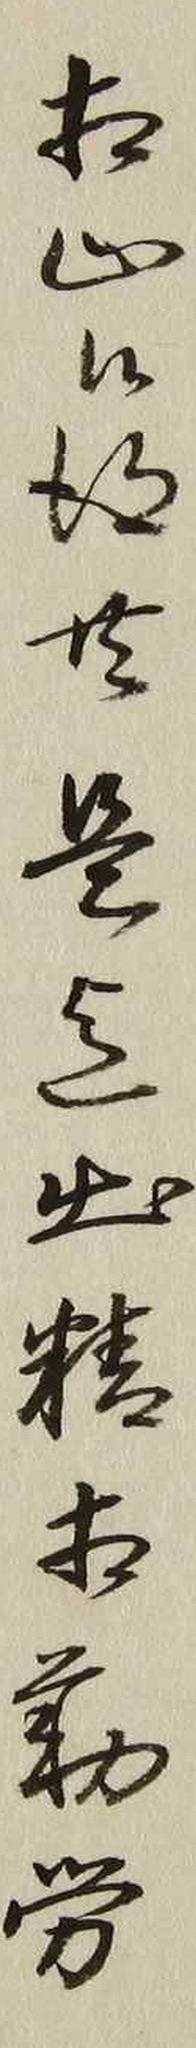相止候得共是迄出精相勤労
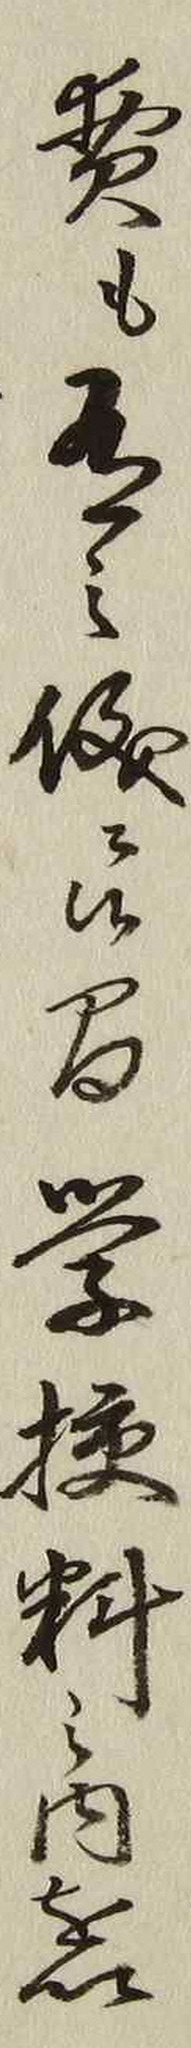費も有之儀ニ候間学校料之内を以
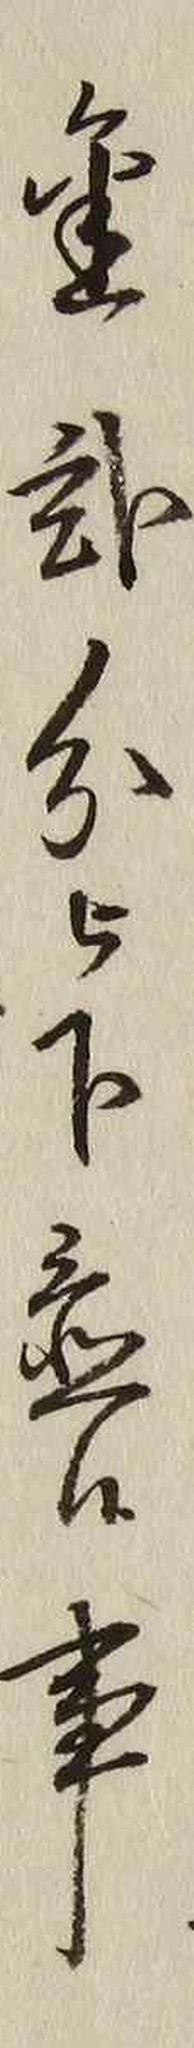金弐分被下置候事
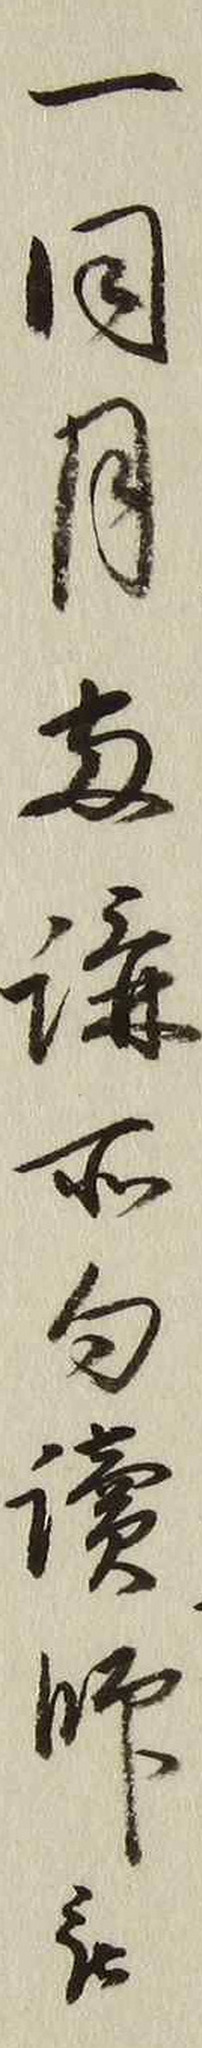一同月両講所句読師被
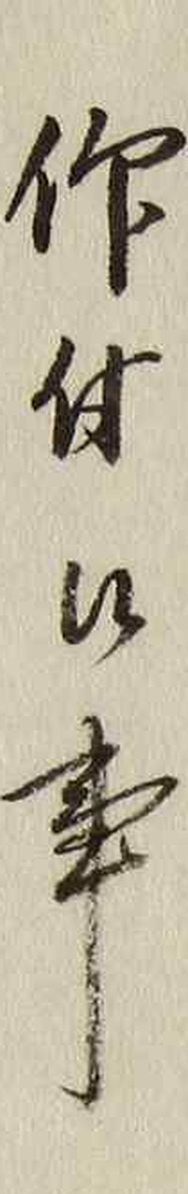仰付候事
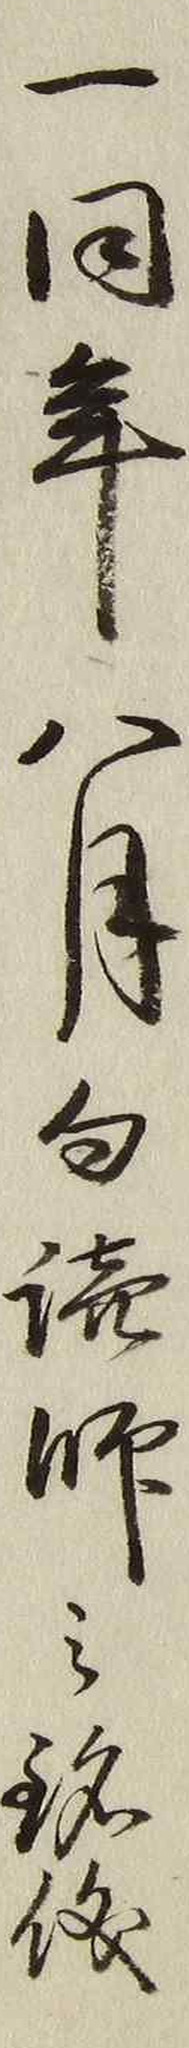一同年八月句読師之銘儀
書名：諸士系譜　巻之136　た之部12
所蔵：会津若松市立会津図書館
